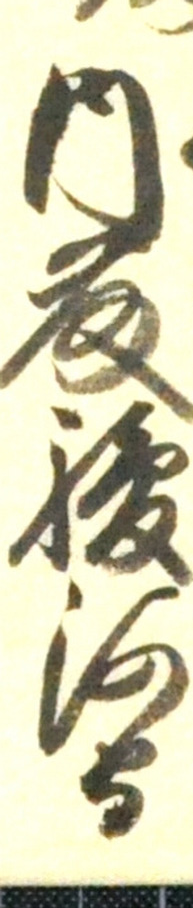内藤駿河守

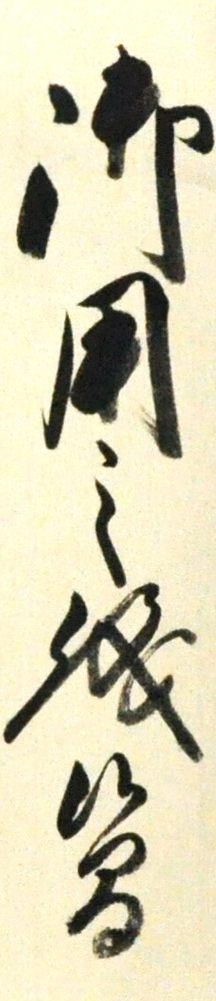御用之儀候間
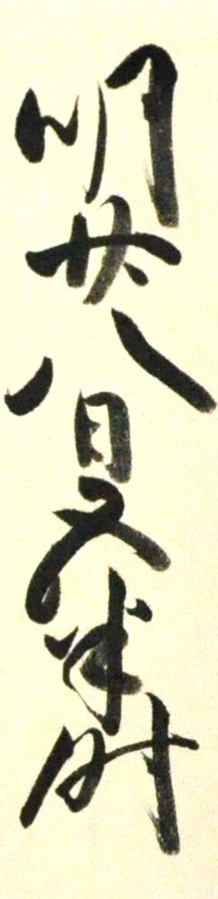明廿八日五半時
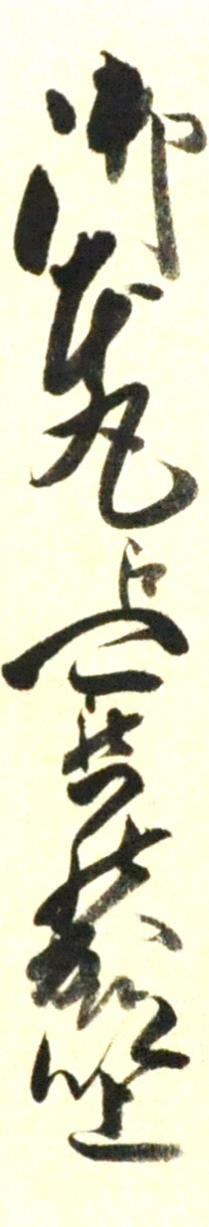御本丸江可被罷出候以上
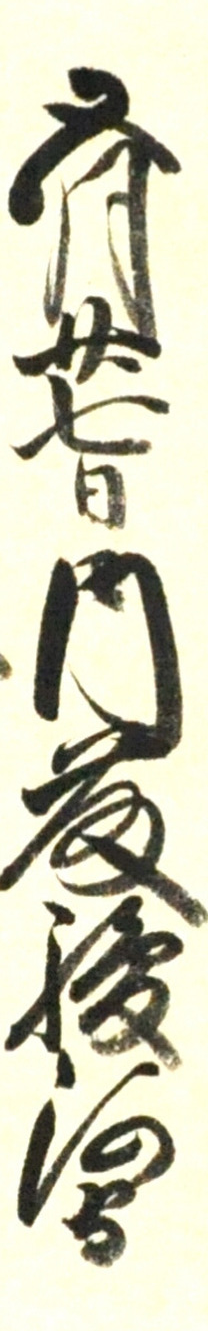五月廿七日内藤駿河守
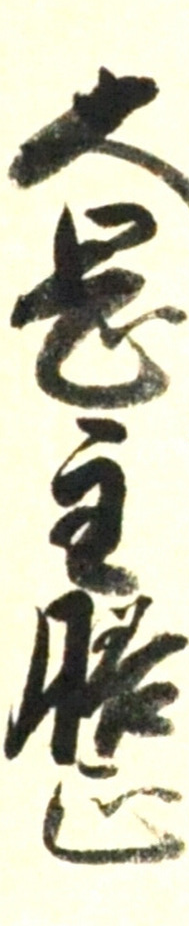大岡主膳正
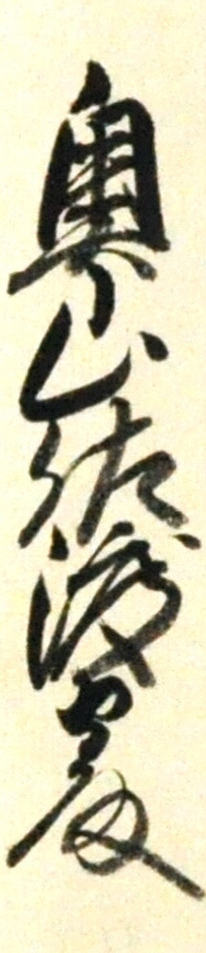奥山佐渡守殿
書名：御奉書
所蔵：伊那市立高遠町図書館・合同会社AMANE
